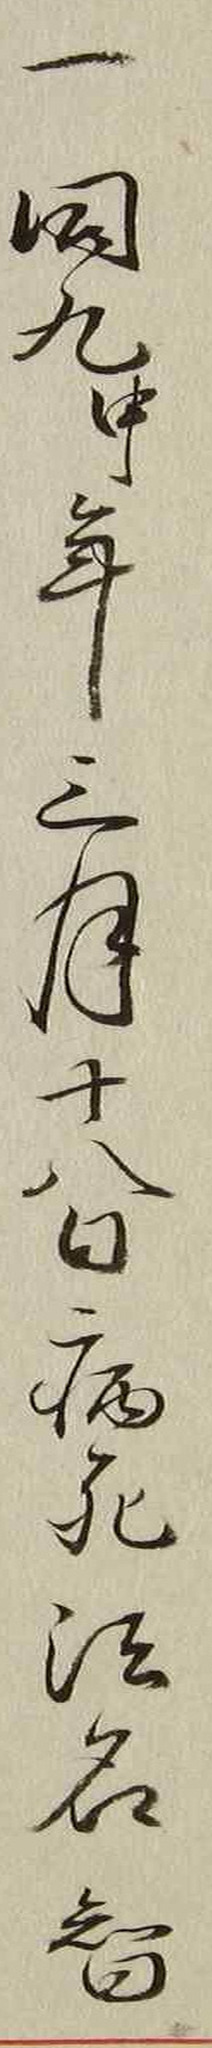一同九申年三月十八日病死法名智
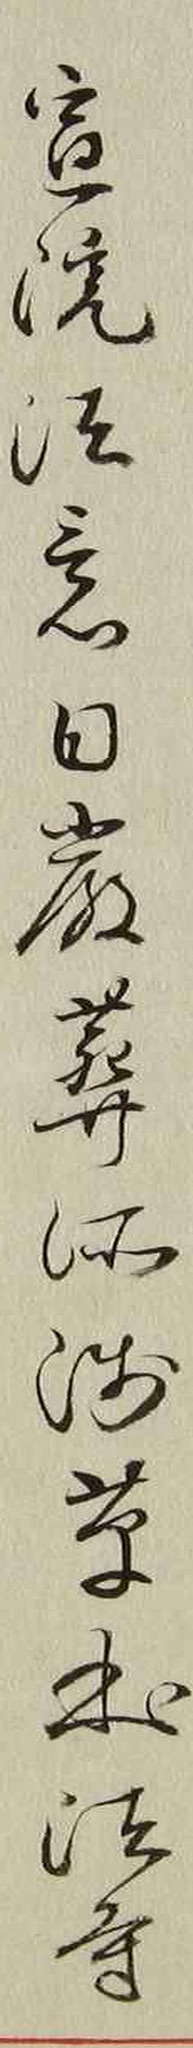宣院法意日厳葬所浅草本法寺
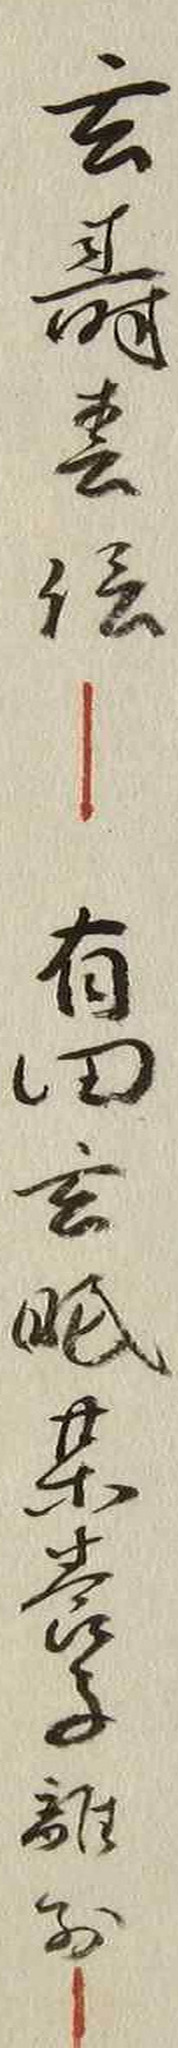玄寿春信有田玄眠某養子離別
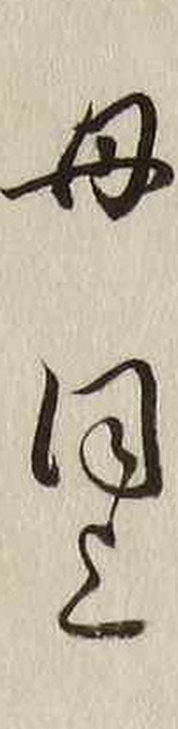母同上
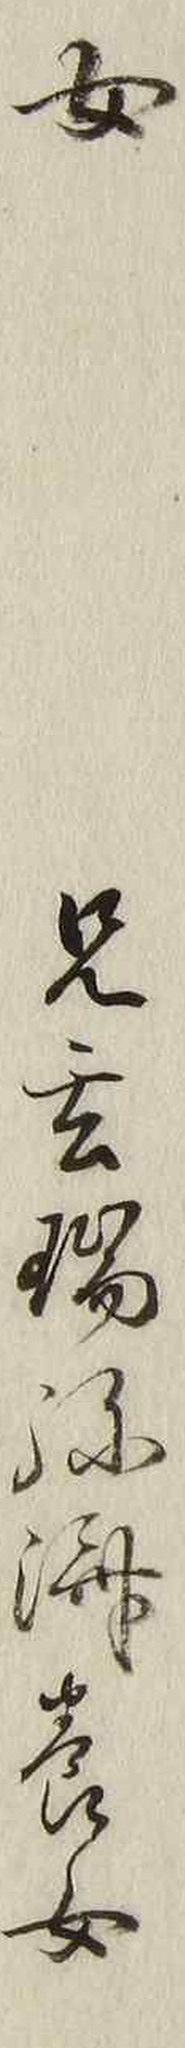女兄玄瑞弥済養女
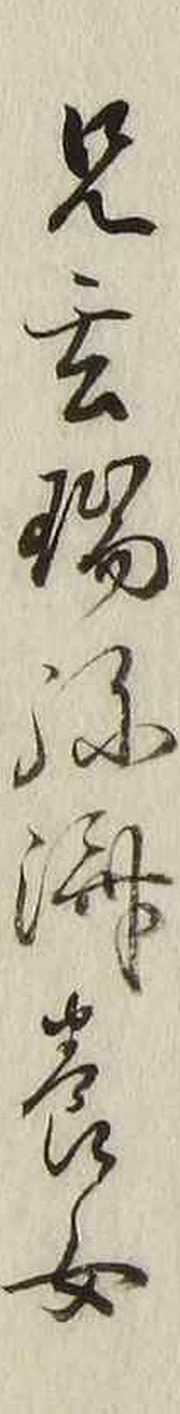女兄玄瑞弥済養女

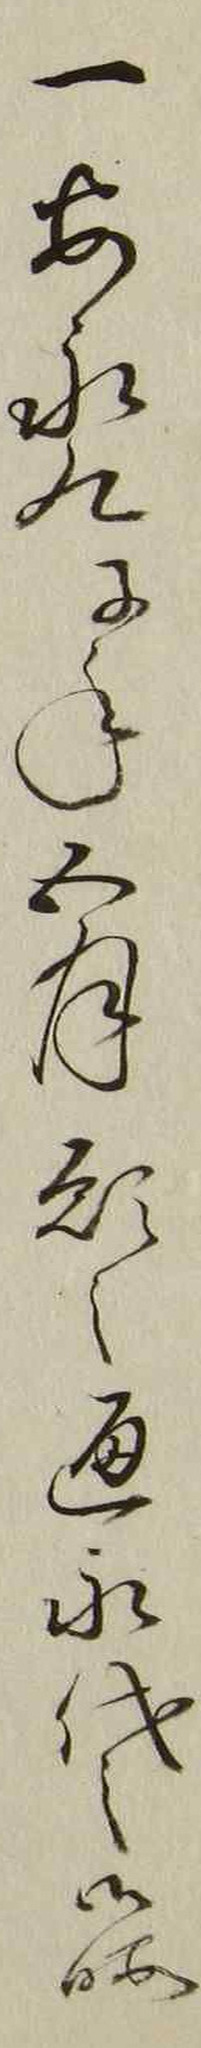一安永九子年五月願之通永代之御暇
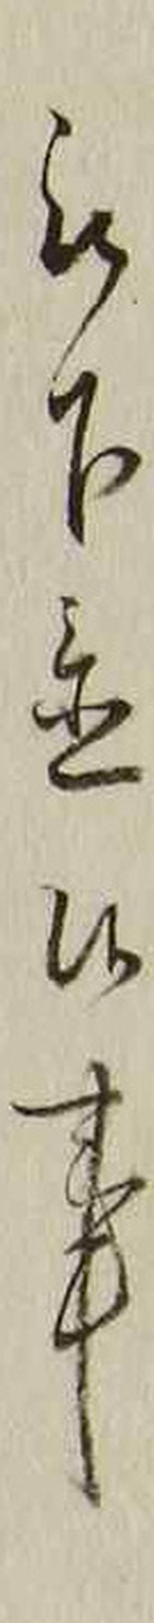被下置候事
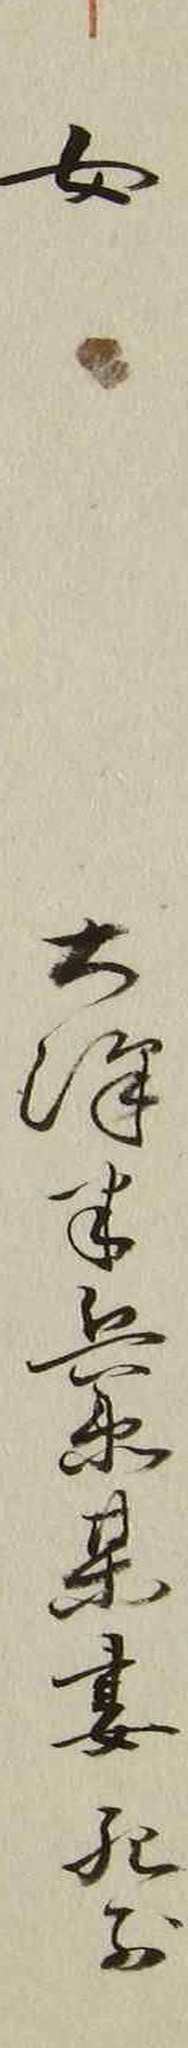女大澤半兵衛某妻死別
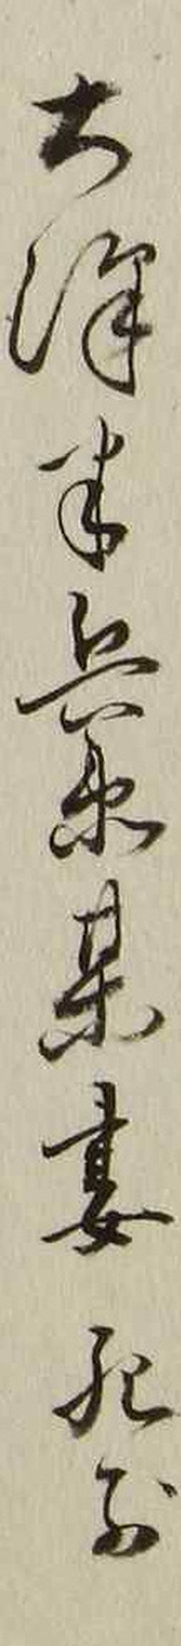女大澤半兵衛某妻死別
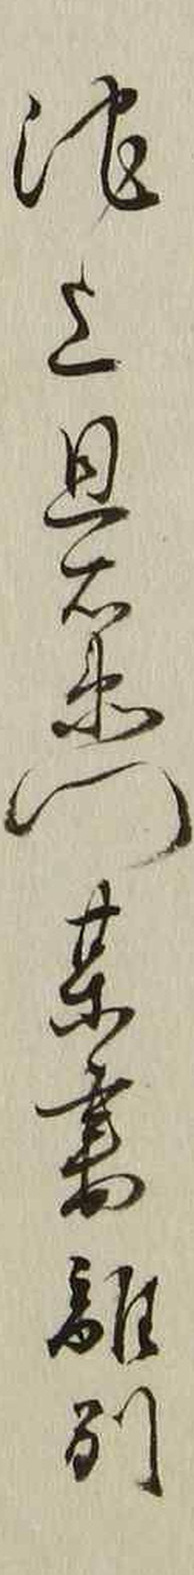池上且右衛門某妻離別
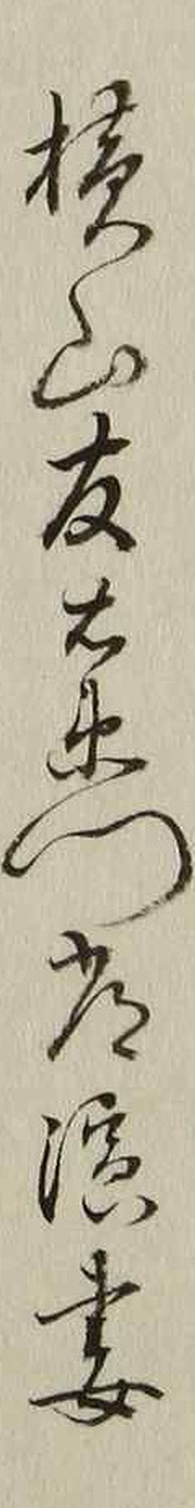横山友右衛門常演妻
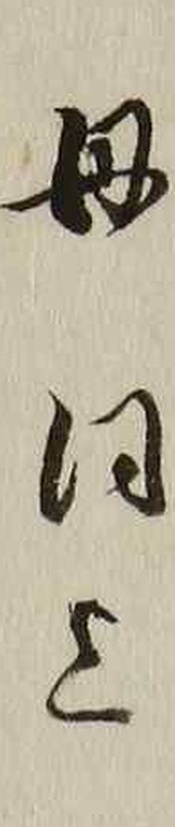母同上
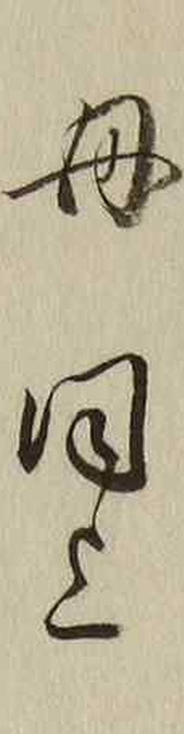母同上
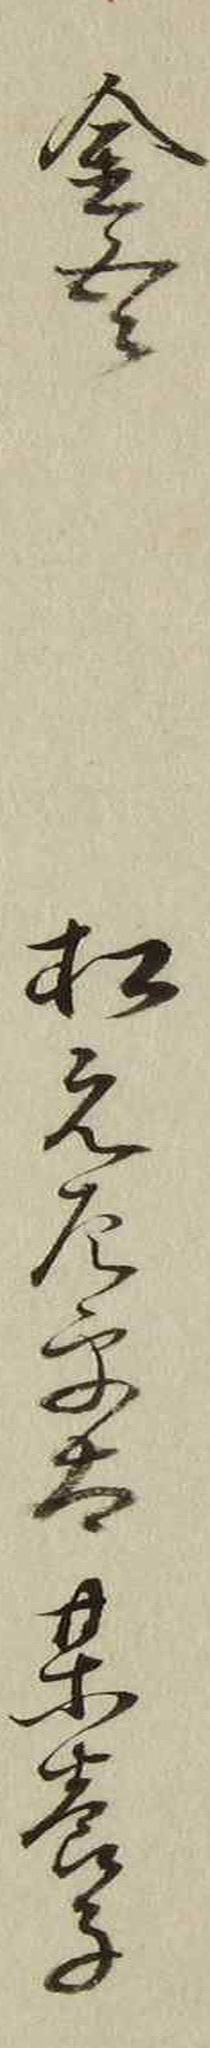金吾松元左兵太某養子
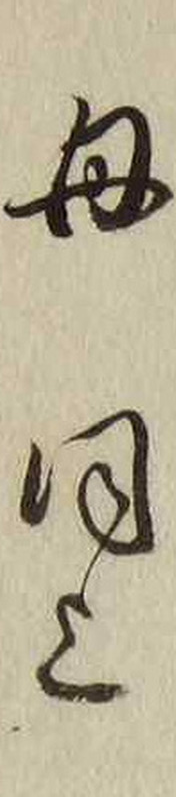母同上
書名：諸士系譜　巻之8　い之部8
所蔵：会津若松市立会津図書館
